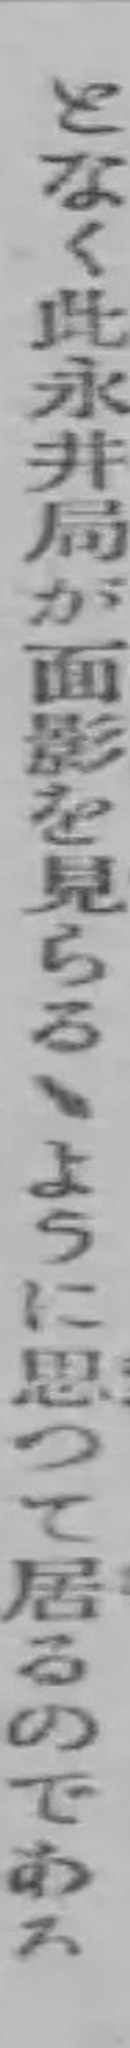となく此永井局が面影を見らるゝように思つて居るのである
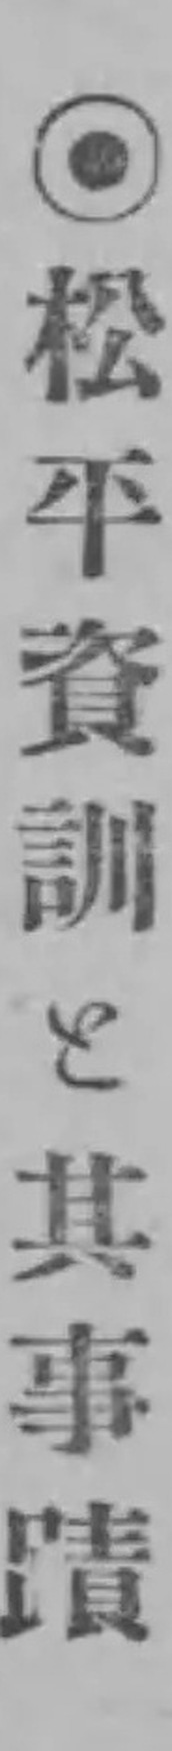⦿松平資訓と其事蹟
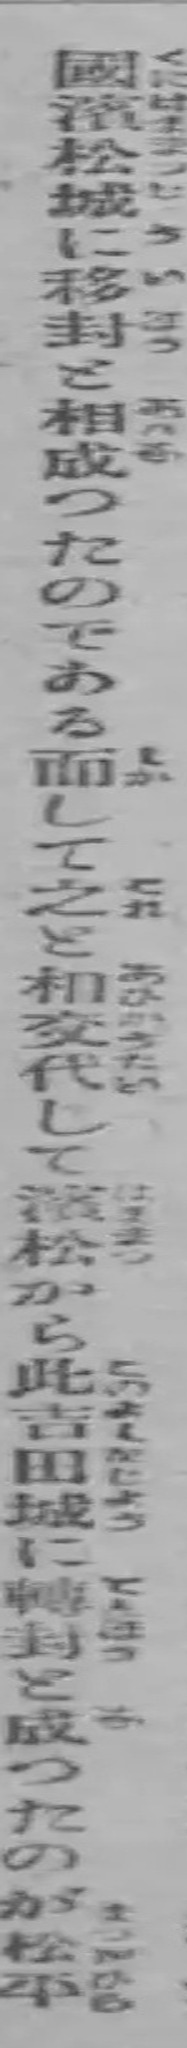国浜松城に移封と相成つたのである而して之と相交代して浜松から此吉田城に転封と成つたのが松平

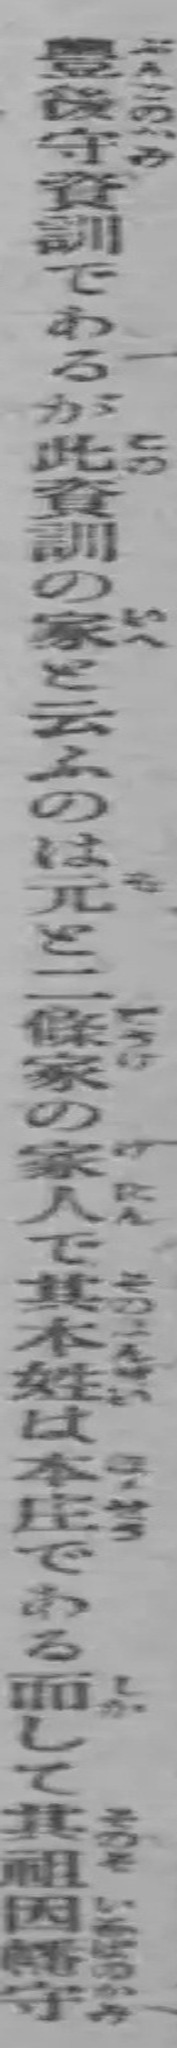本庄宗資豊後守資訓であるが此資訓の家と云ふのは元と二條家の家人で其本姓は本庄である而して其祖因幡守
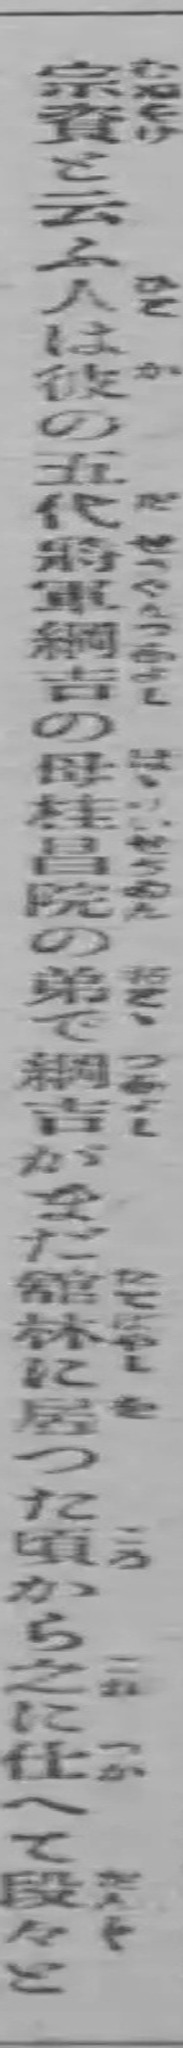宗資と云ふ人は彼の五代将軍綱吉の母桂昌院の弟で綱吉がまだ舘林に居つた頃から之に仕へて段々と
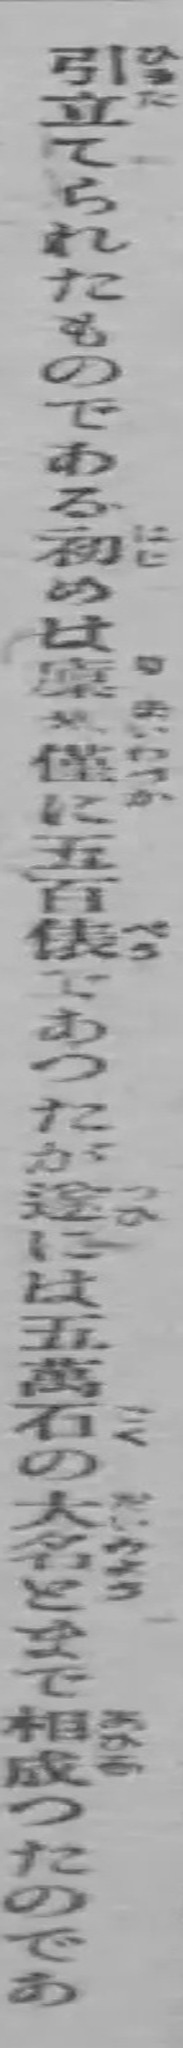引立てられたものである初めは廩米僅かに五百俵であつたが遂には五万石の大名とまで相成つたのであ
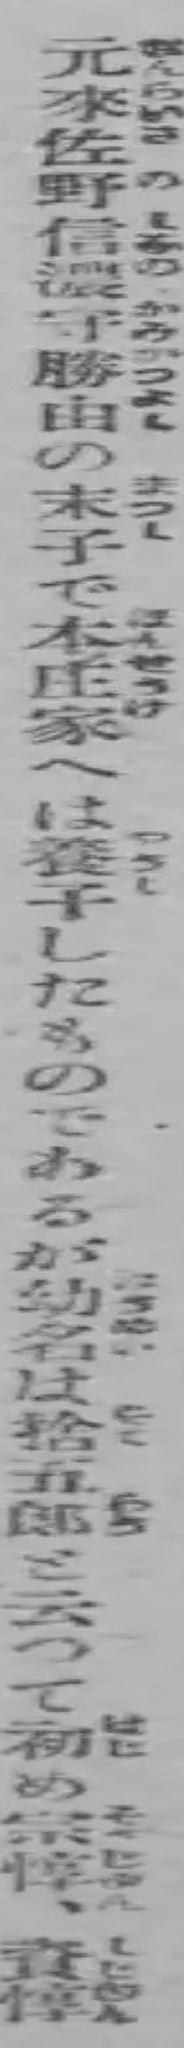元来佐野信濃守勝由の末子で本庄家へは養子したものであるが幼名は捨五郎と云つて初め宗惇、資惇
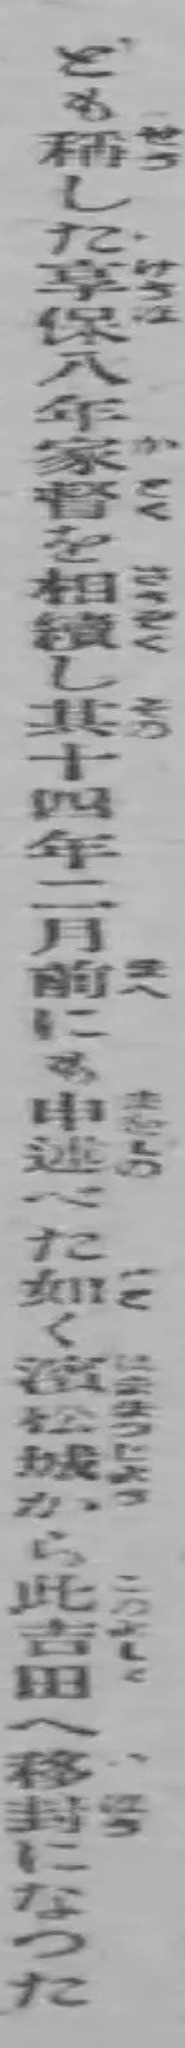とも称した享保八年家督を相続し其十四年二月前にも申述べた如く浜松城から此吉田へ移封になつた
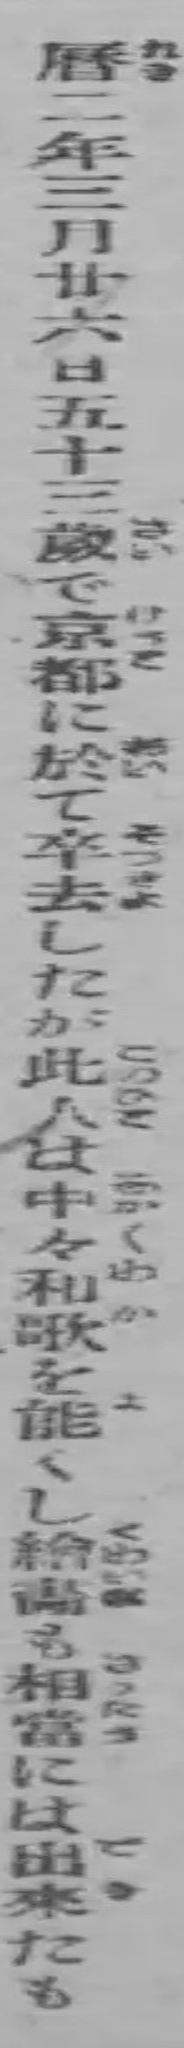らる暦二年三月廿六日五十三歳で京都に於て卒去したが此人は中々和歌を能くし絵画も相当には出来たも
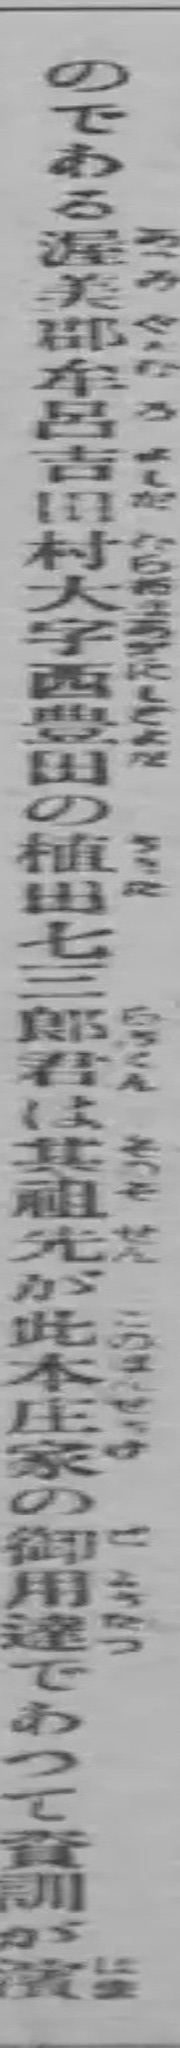のである渥美郡牟呂吉田村大字西豊田の植田七三郎君は其祖先が此本庄家の御用達であつて資訓が浜
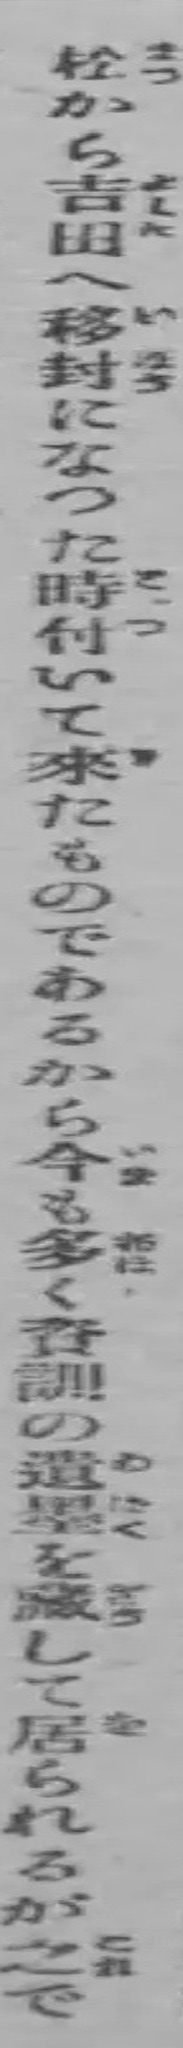松から吉田へ移封になつた時付いて来たものであるから今も多く資訓の遺墨を蔵して居られるが之で
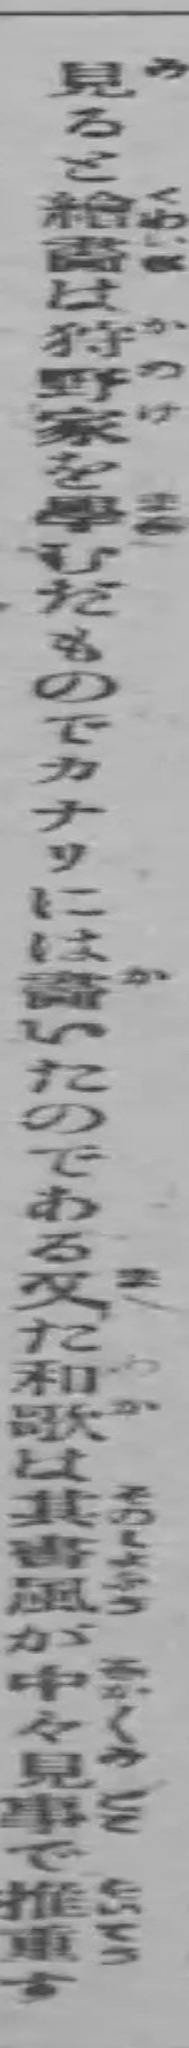見ると絵画は狩野家を学むだものでカナリには画いたのである又た和歌は其書風が中々見事で推重す
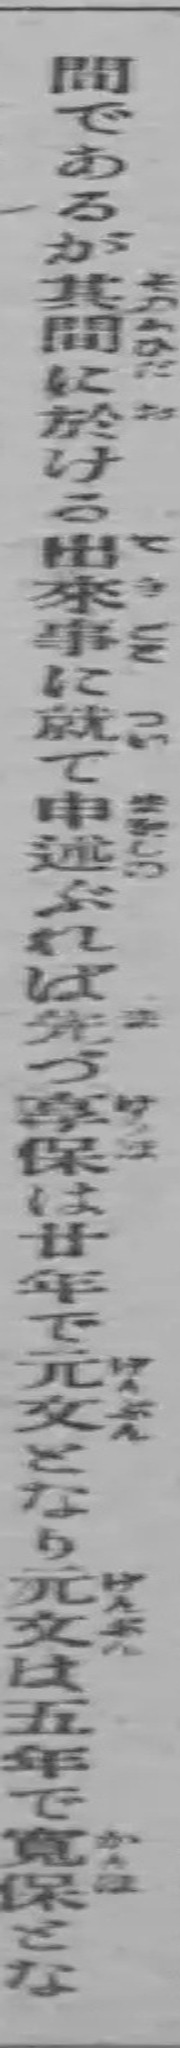間であるが其間に於ける出来事に就て申述ぶれば先づ享保は廿年で元文となり元文は五年で寛保とな
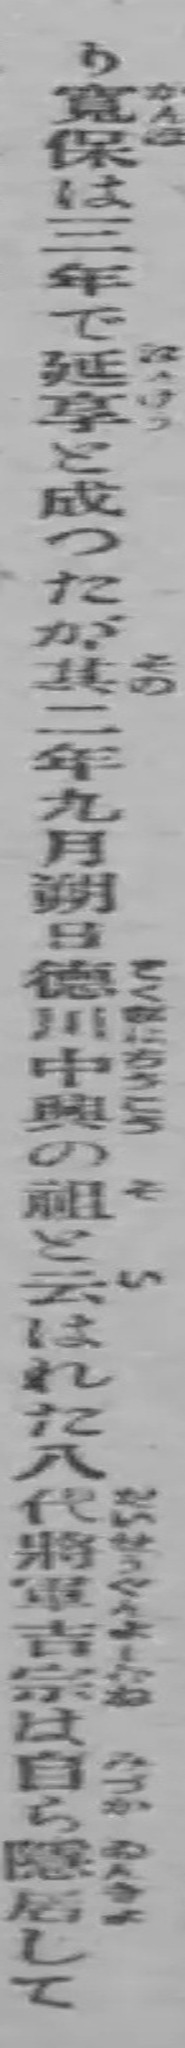り寛保は三年で延享と成つたが其二年九月朔日徳川中興の祖と云はれた八代将軍吉宗は自ら隠居して
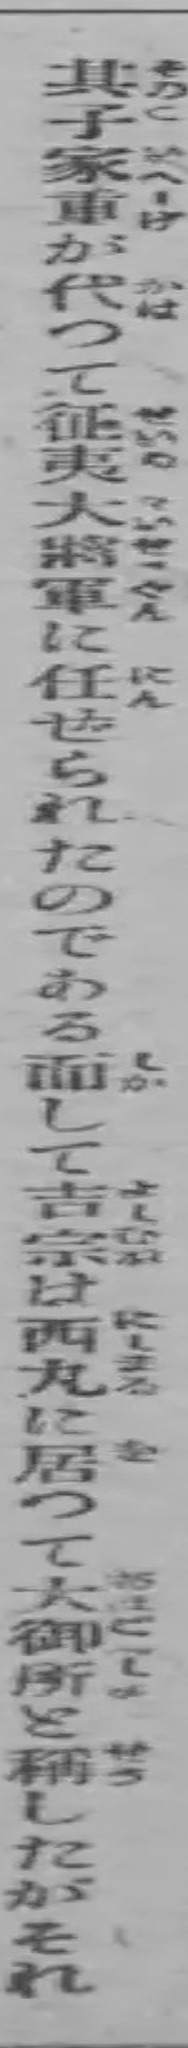其子家重が代つて征夷大将軍に任ぜられたのである而して吉宗は西丸に居つて大御所と称したがそれ
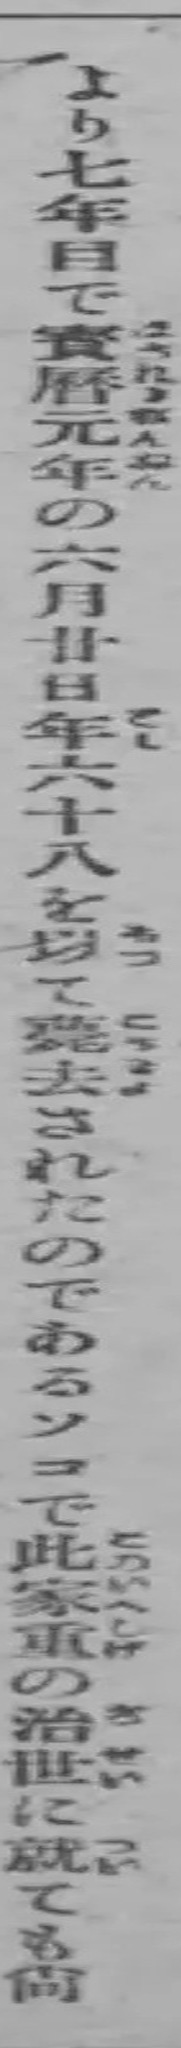より七年目で宝暦元年の六月廿日年六十八を以て薨去されたのであるソコで此家重の治世に就ても尚
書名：豊橋市史談
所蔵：国立国会図書館 National Diet Library, JAPAN
